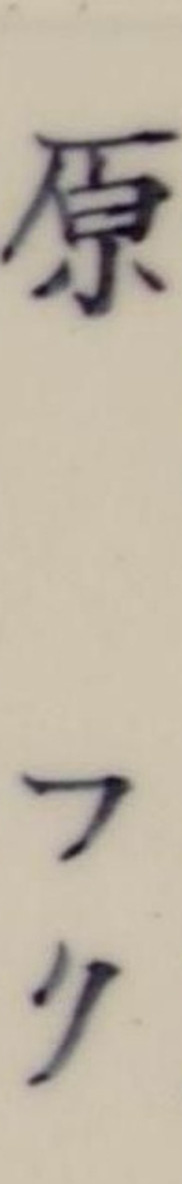原フク
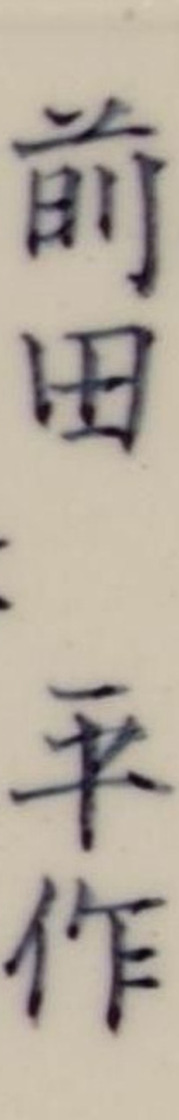前田平作
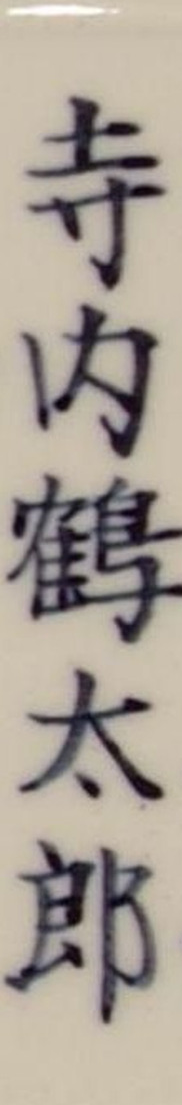寺内鶴太郎
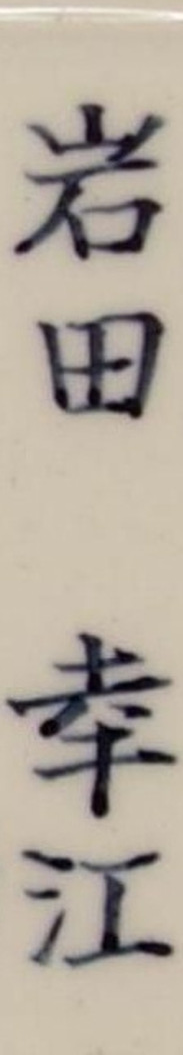岩田幸江
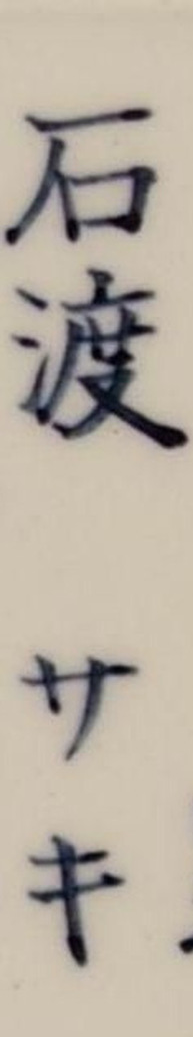石渡サキ
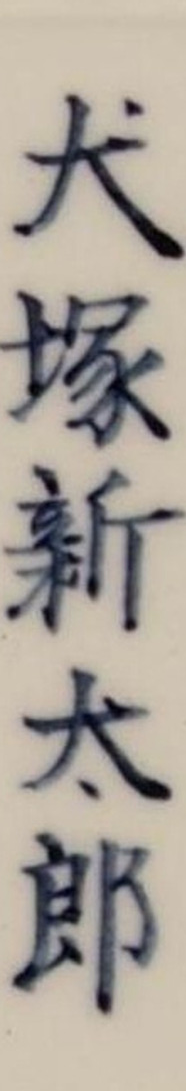犬塚新太郎
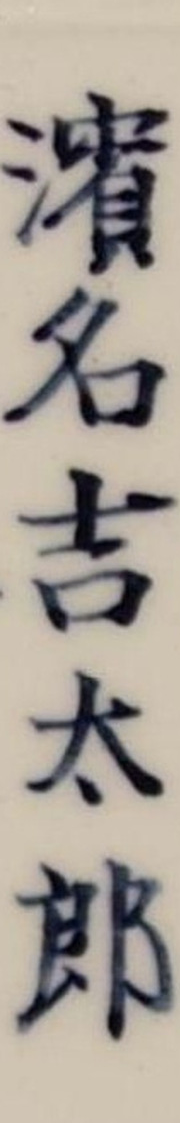濱名吉太郎
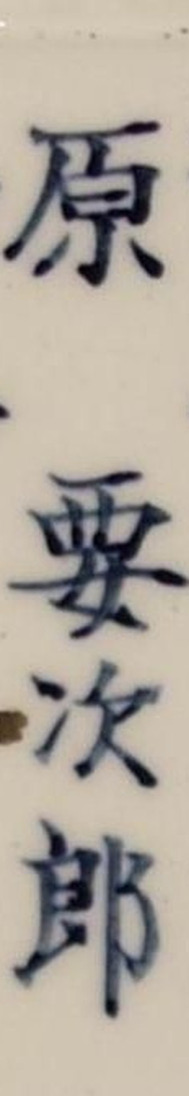原要次郎
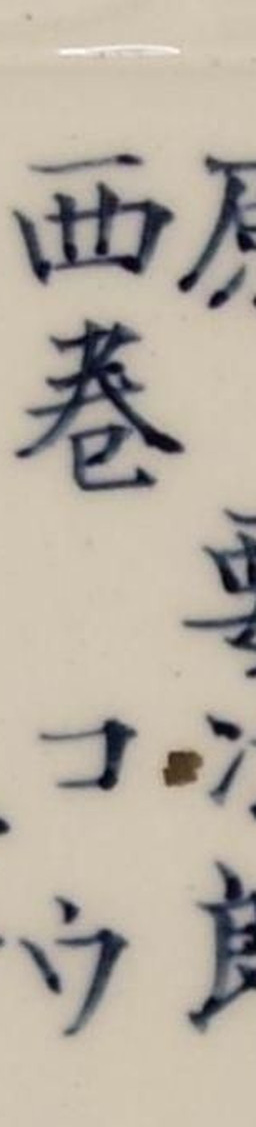西巻コウ
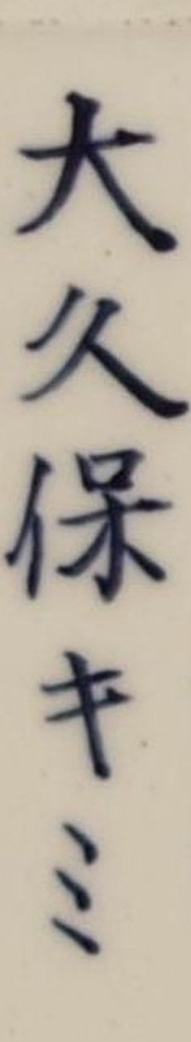大久保キミ
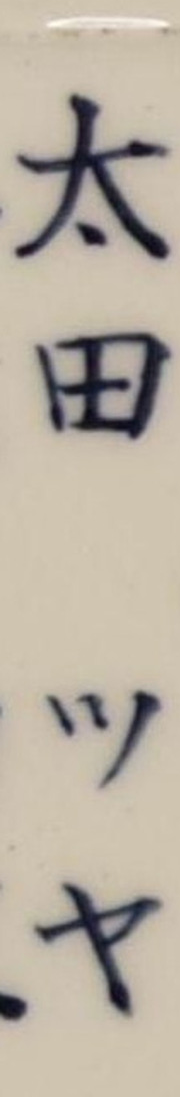太田ツヤ
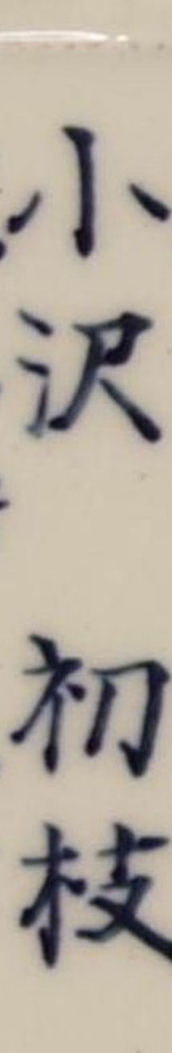小沢初枝
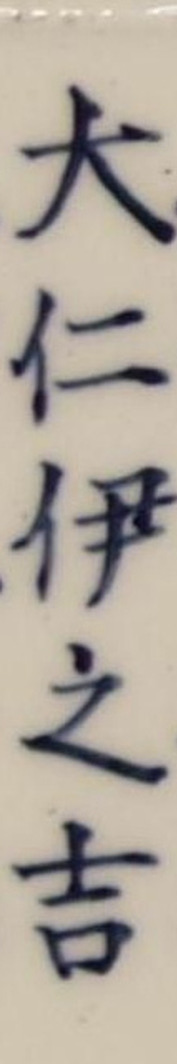大仁伊之吉
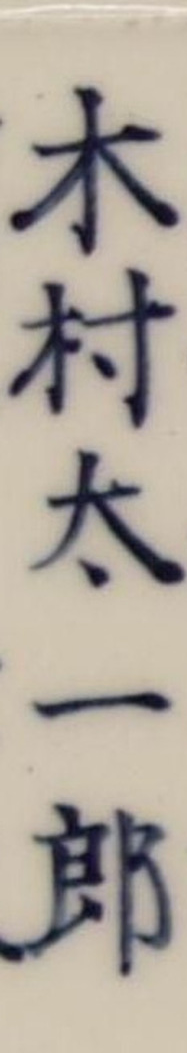木村太一郎
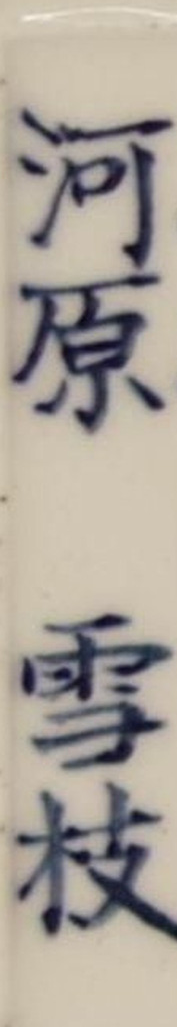河原雪枝

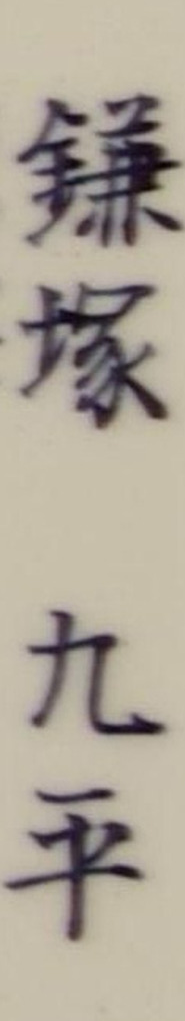鎌塚九平
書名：M~S
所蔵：高野山金剛峯寺
